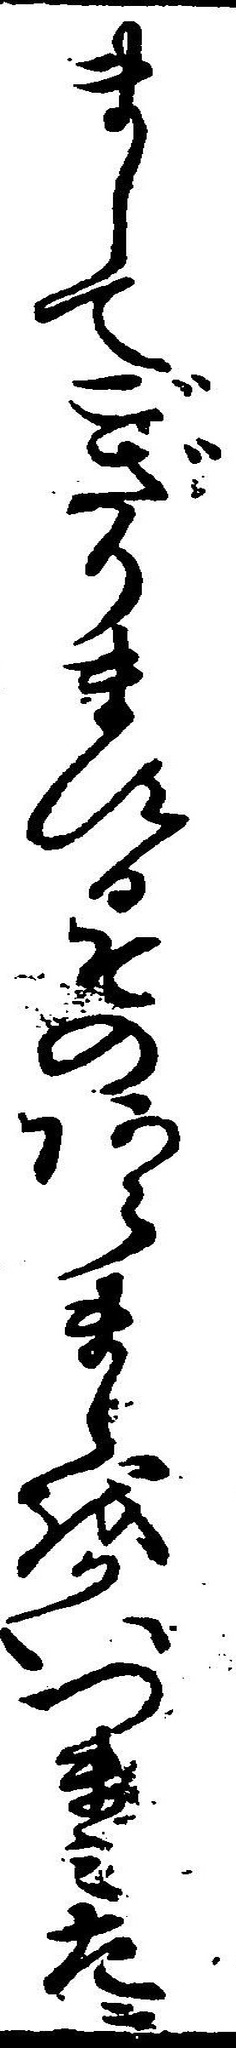ましてござりまするそのあらましをかいつまみ左
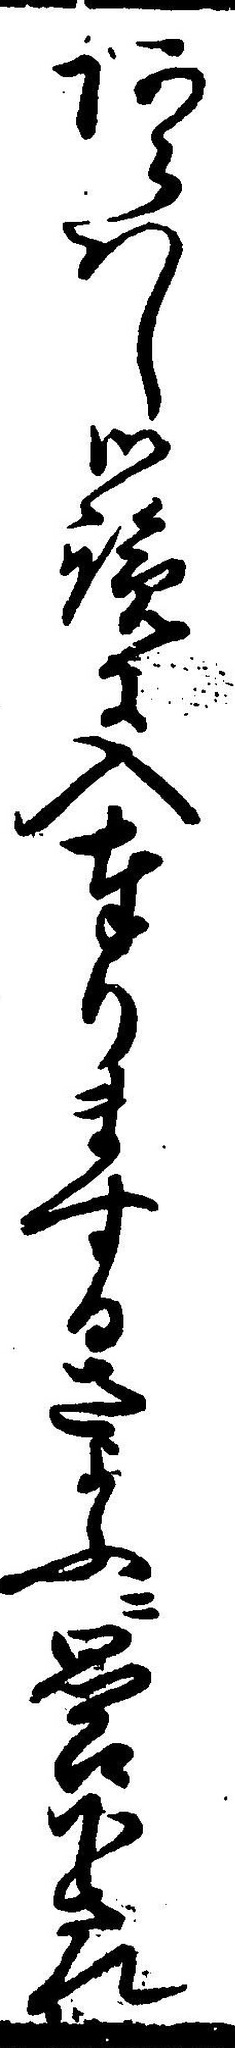あらはし御覧に入奉りまするさよふ思召下され
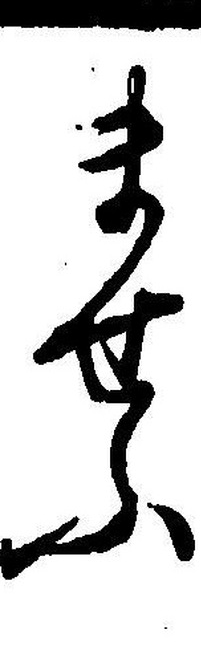ませふ
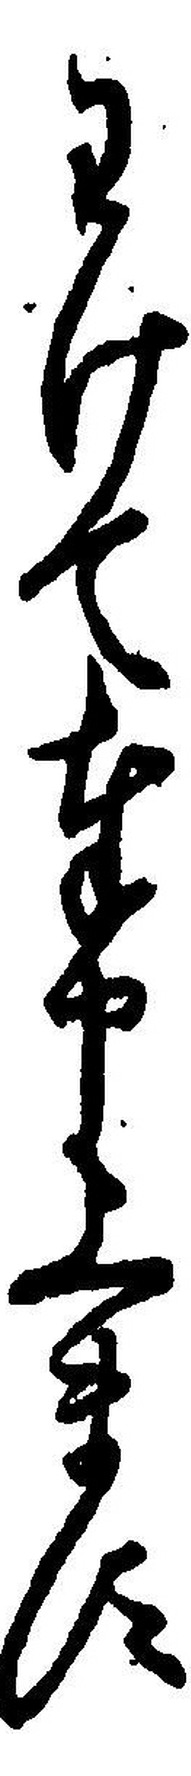わけて奉申上ます
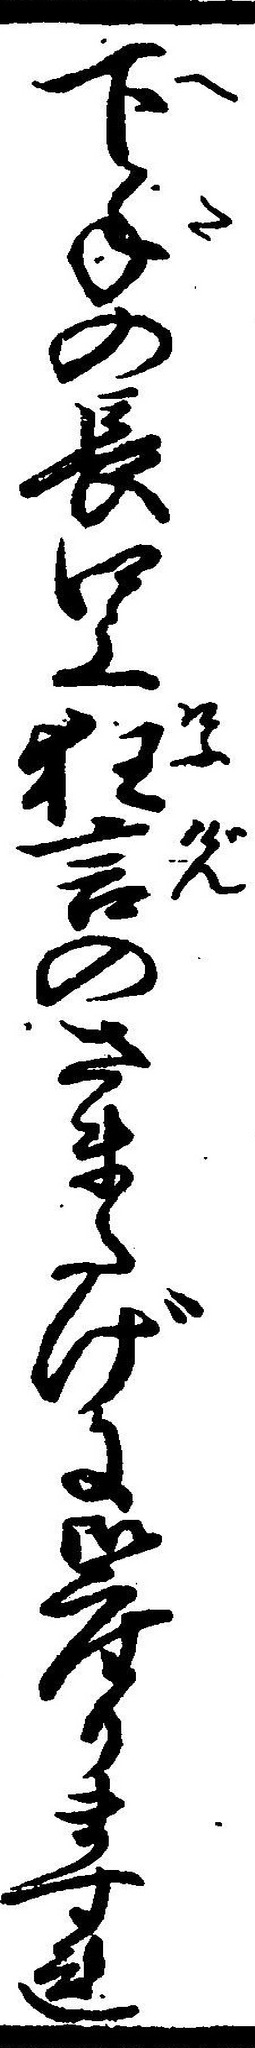下手の長口上狂言のさまたげに御座りますれ
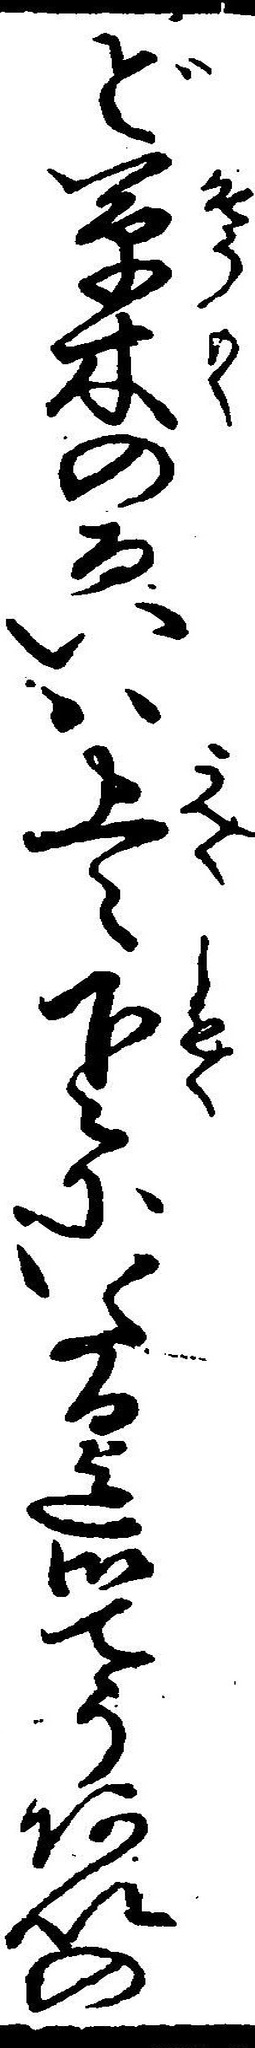ど草木のるいは上々下々にいたる迄御てうあいの

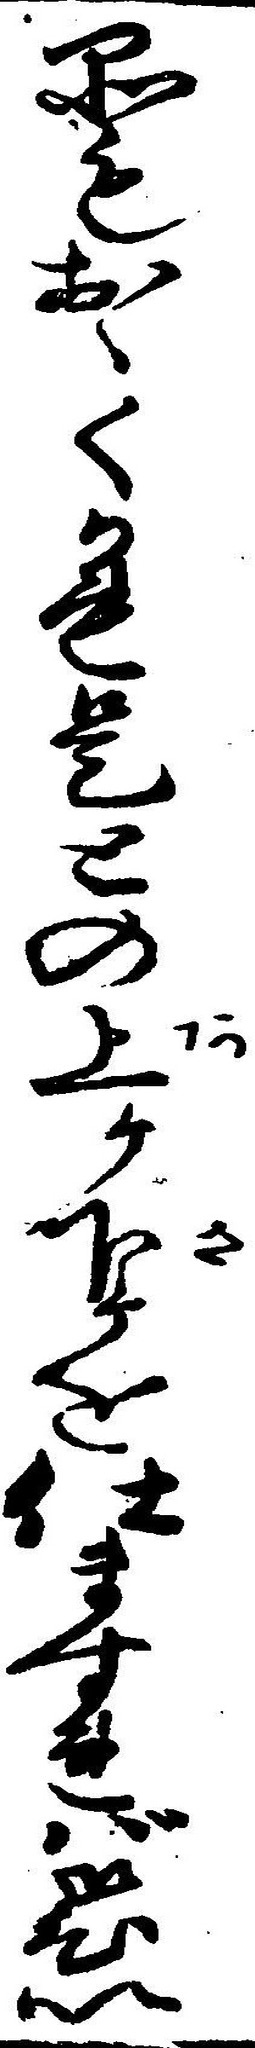品もおゝくかれ是との上下仕ますれば御心い
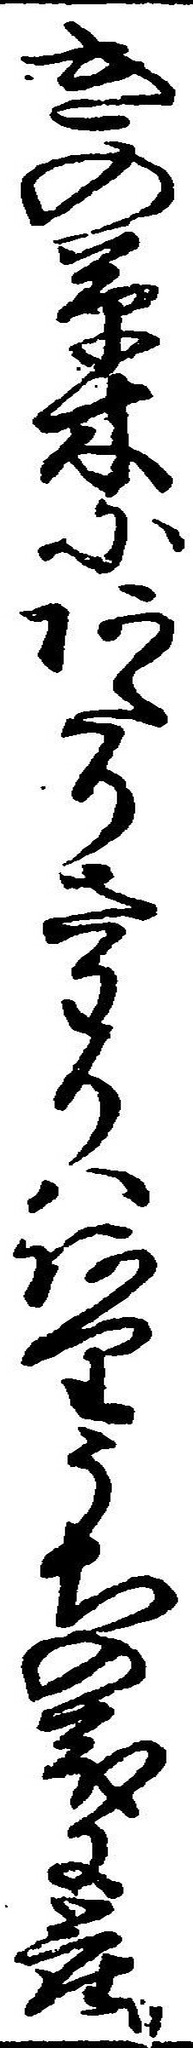きの草木にあたりさわりはありうちの義に御座
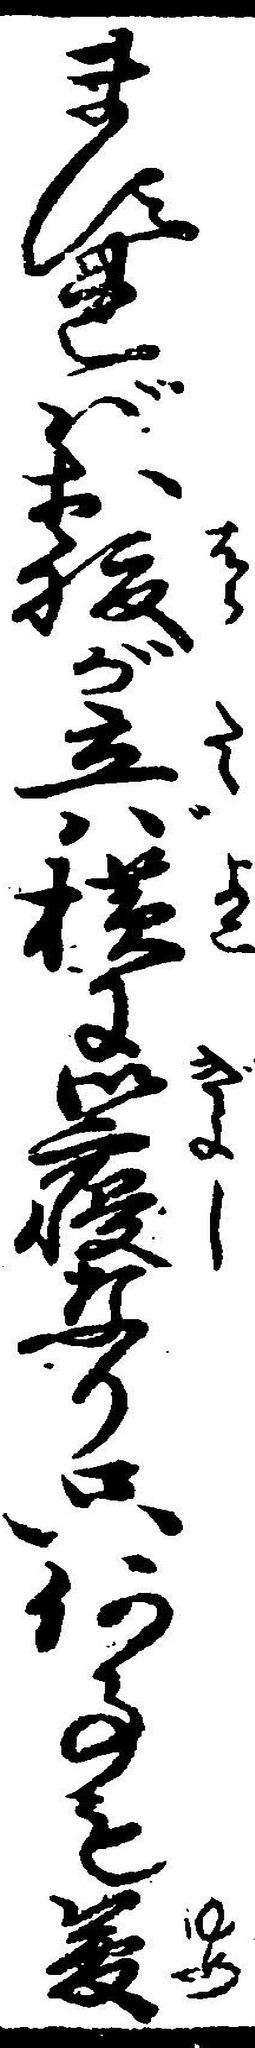ますればお腹が立ば横に御寝なり只何事も夢
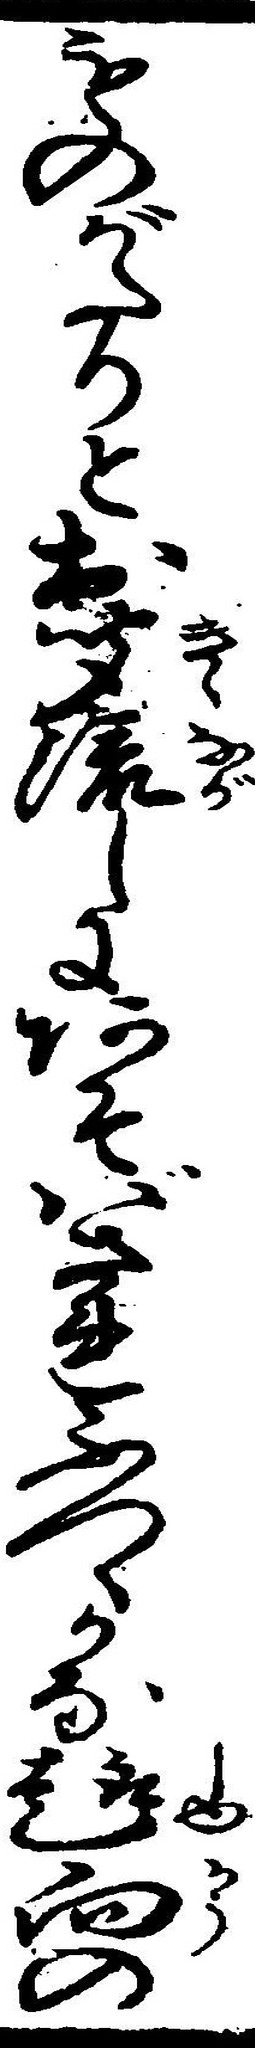ものがたりとお聞流しにあそばされふつゝかな趣向の
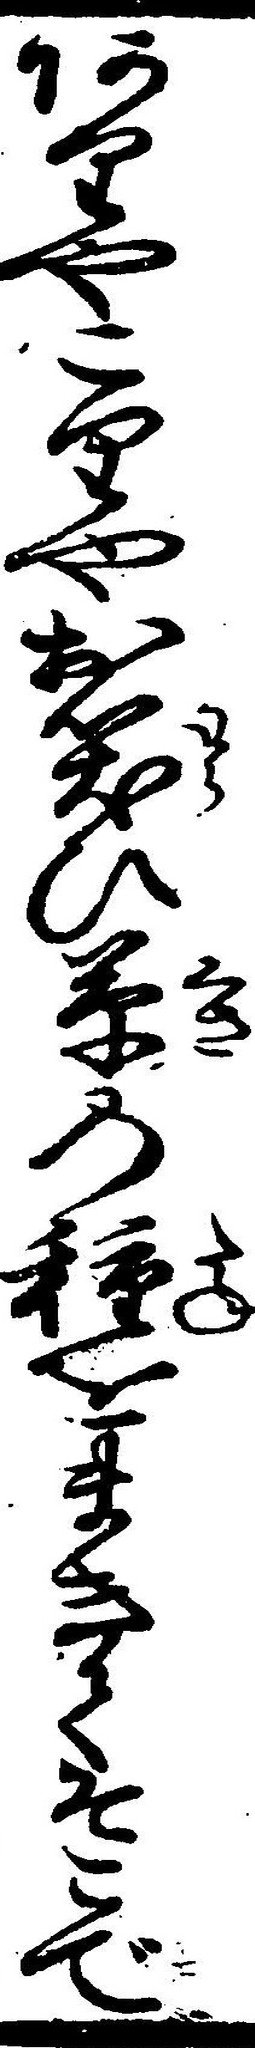ありやこりやお笑ひ草の種をまきてそこで
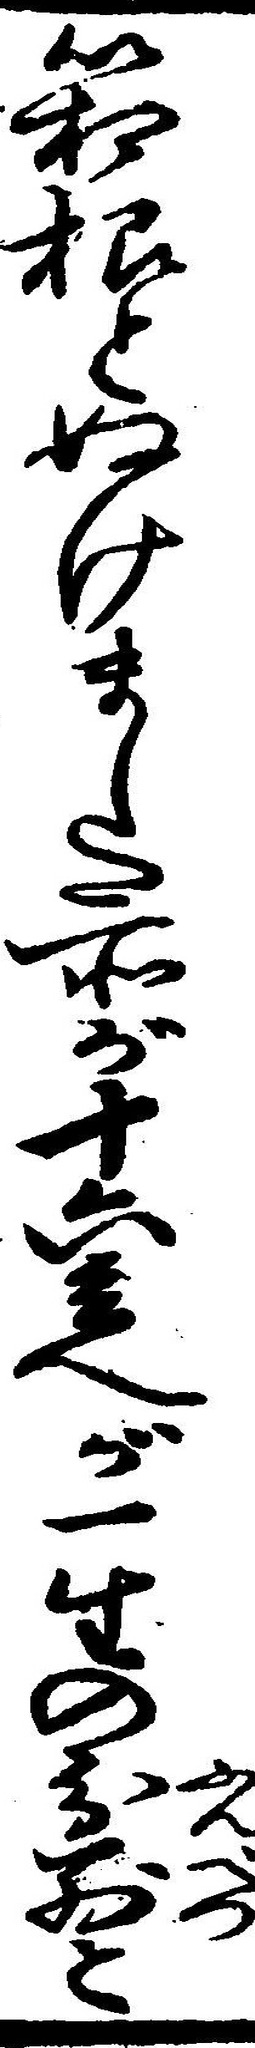箱根とぬけました所が十六兵衛が一生の分別と
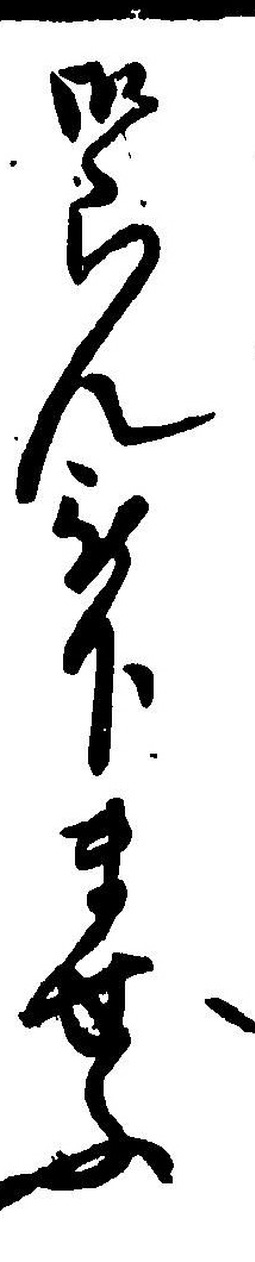御らん被下ませふ
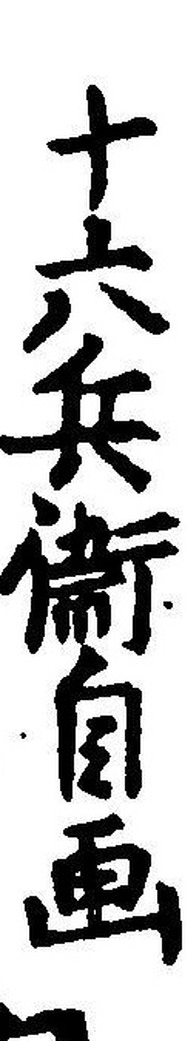十六兵衛自画

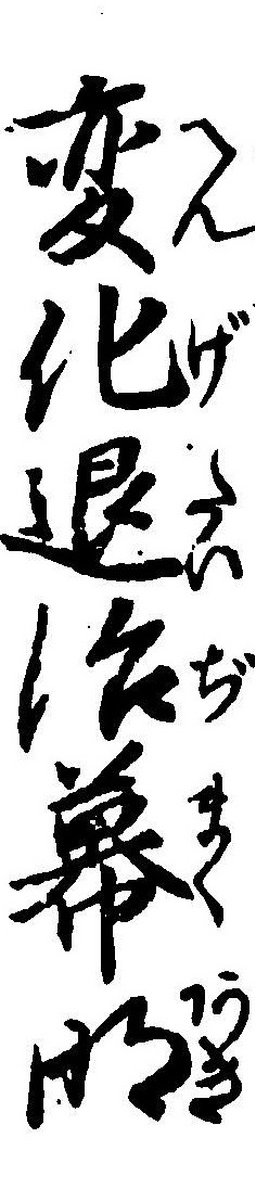変化退治幕明
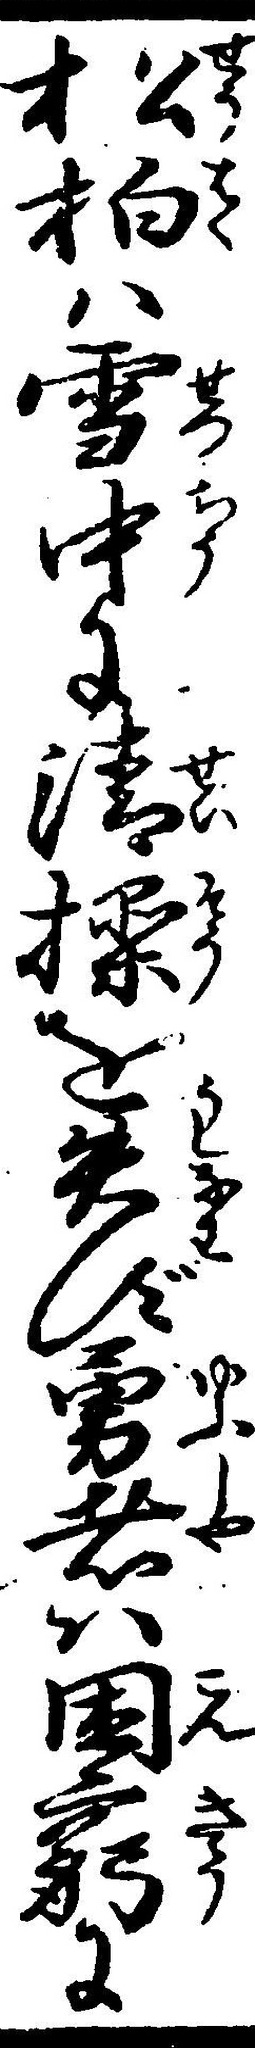松柏は雪中に清操を失ず勇者は困窮に
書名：草木芝居化物退治 / 泉花堂三蝶(十六兵衛)作
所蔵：東京大学総合図書館 General Library in the University of Tokyo, JAPAN
